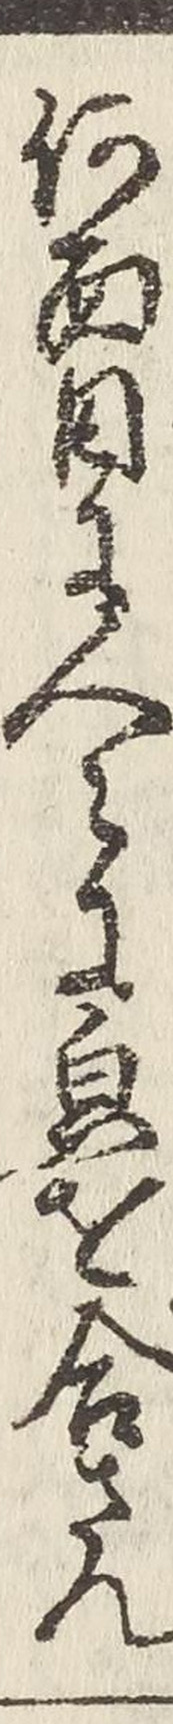何面目に人々に貌を合さん
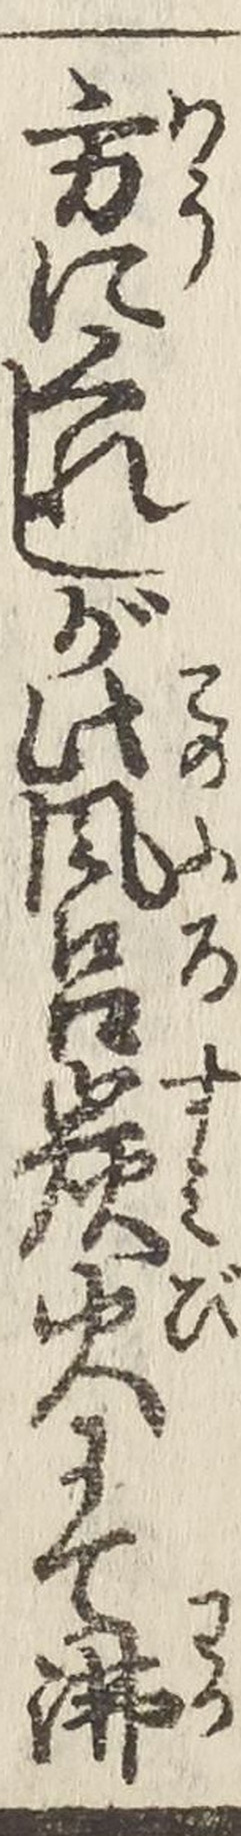方にくれしが此風呂炭火にて沸
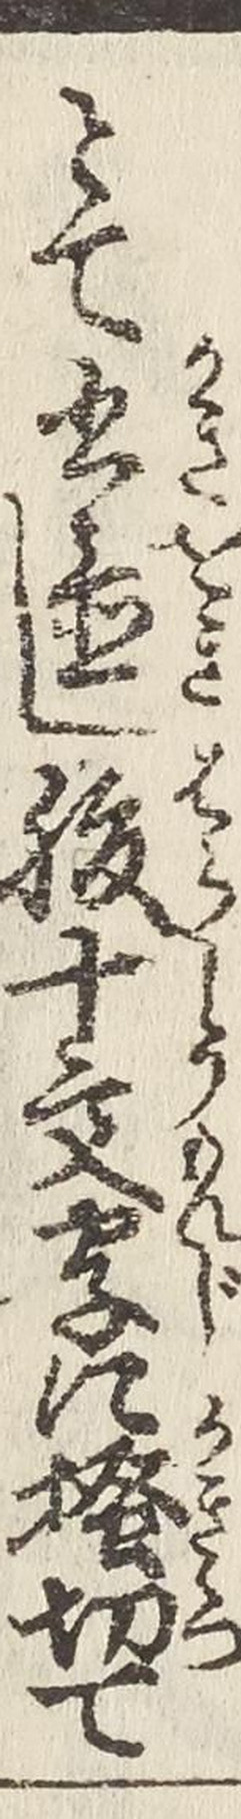とて書置し腹十文字に掻切て
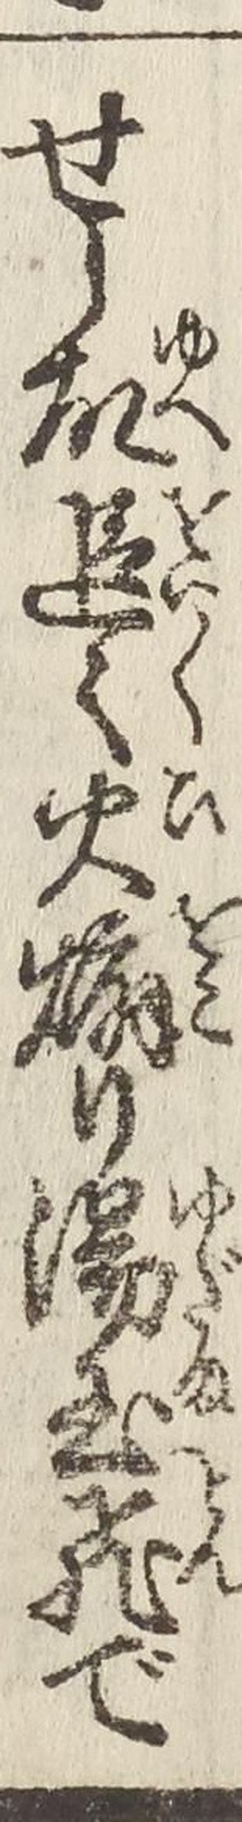せし故追々火煽り湯玉飛で
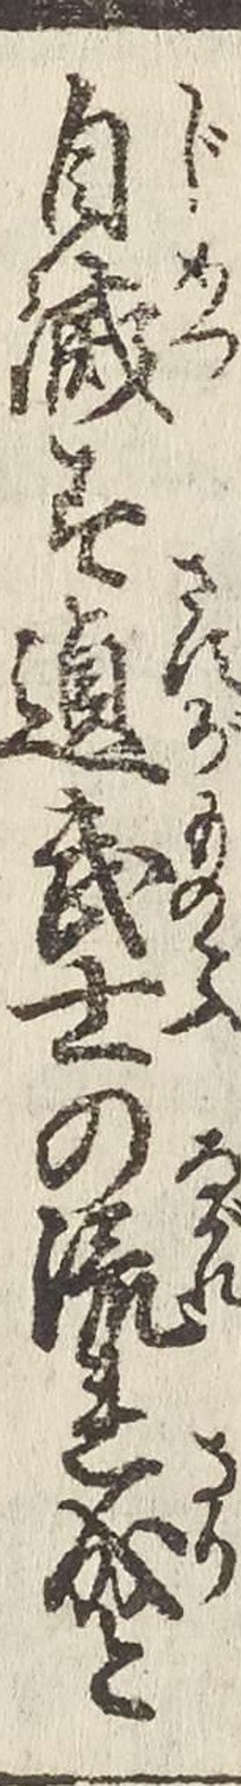自滅す遉武士の流れ成と
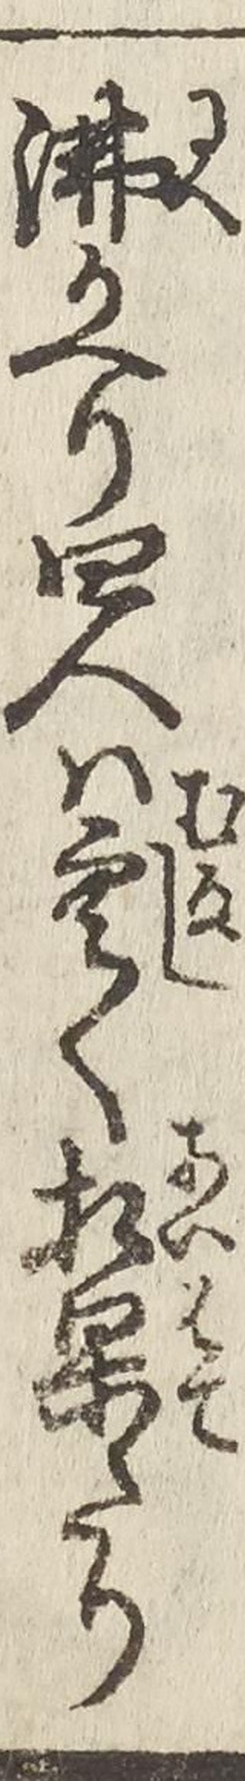沸かへり四人は空く相果たり

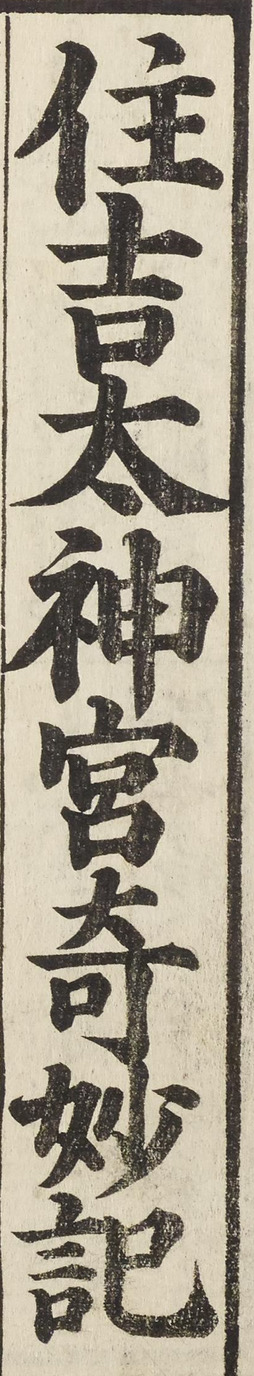住吉太神宮奇妙記

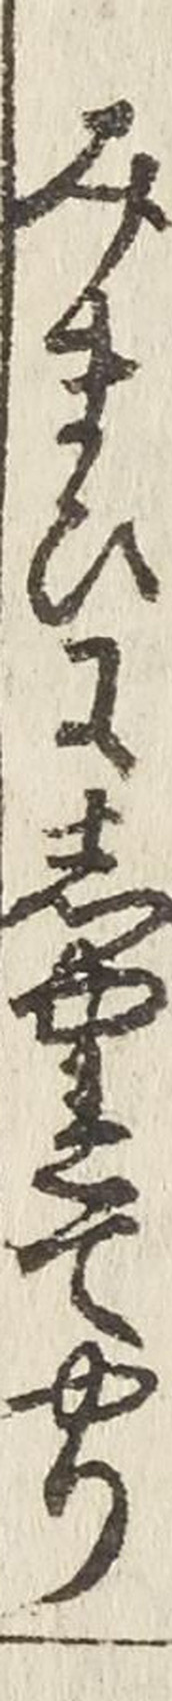みまひにしやれてやり

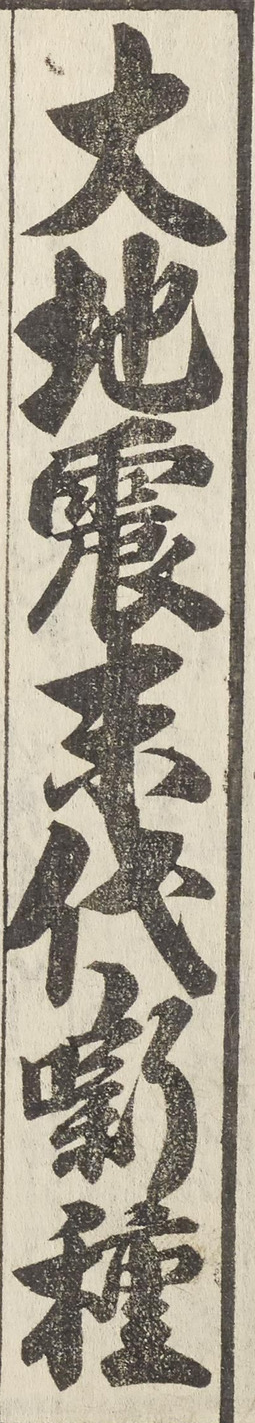大地震末代噺種
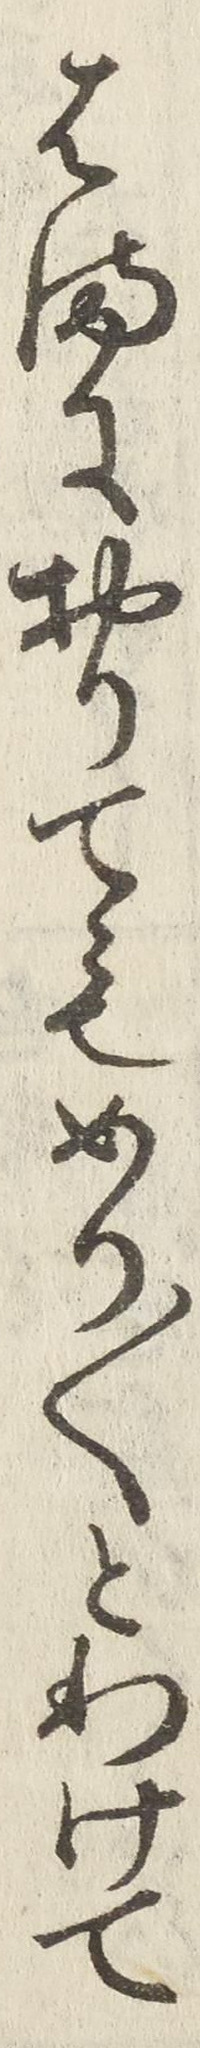はまにおりてもめり〳〵とわけて
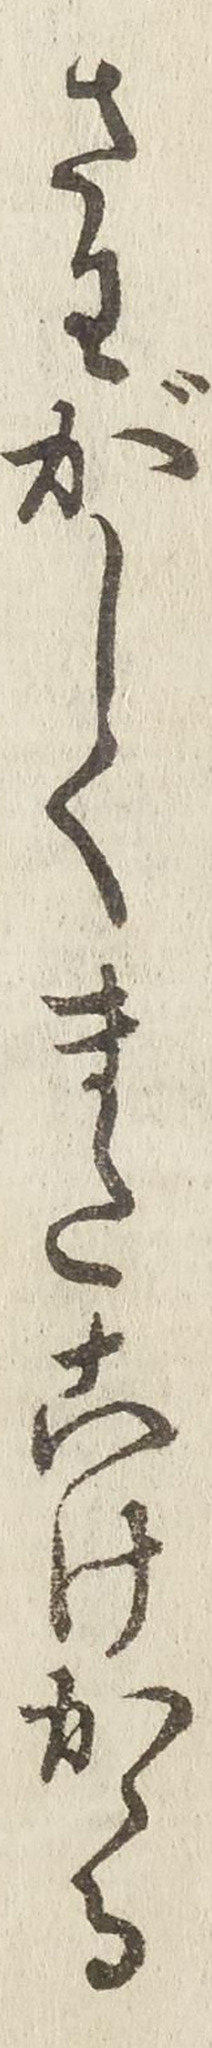さわがしくまたこけかゝる
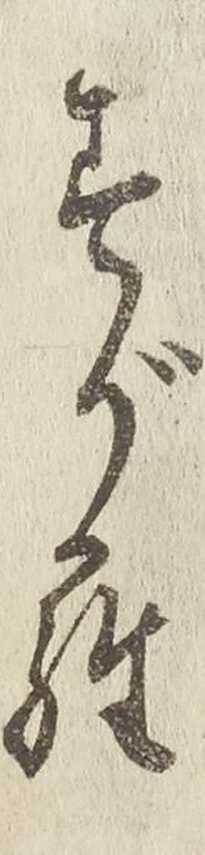すがら

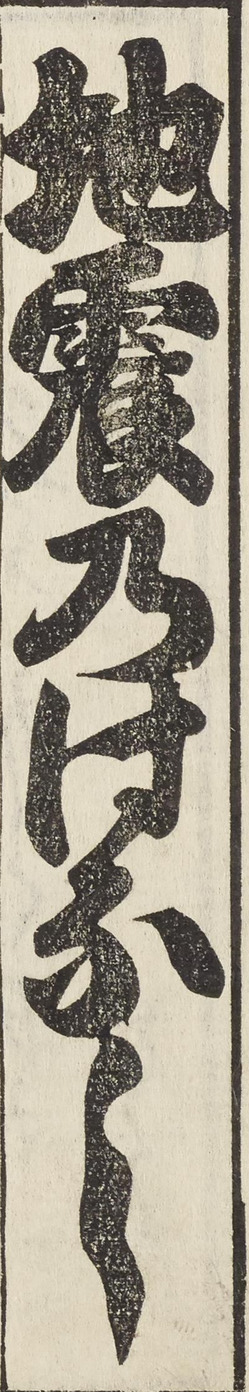地震のはなし
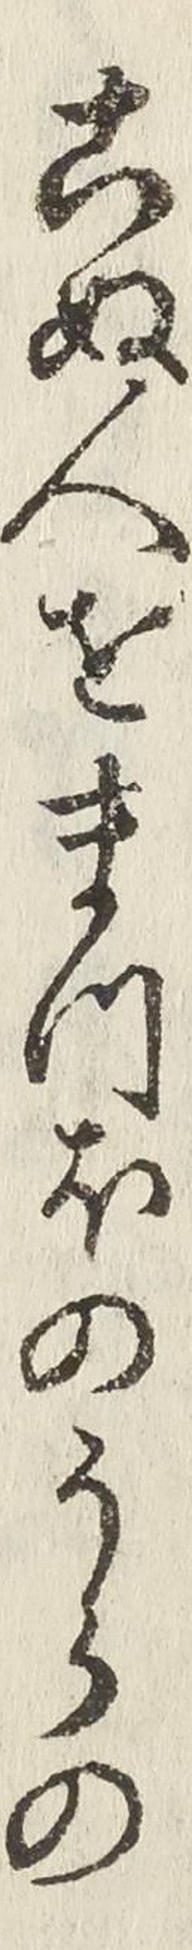こぬ人をまつほのうらの

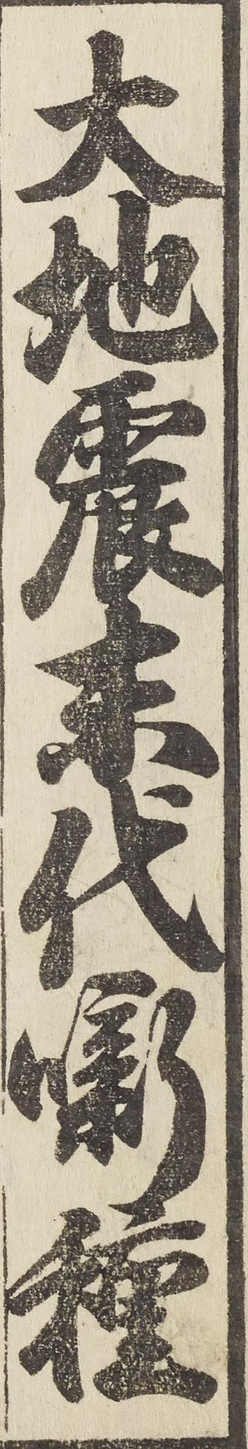大地震末代噺種
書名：大地震大（津浪）末代噺（の）種　三編全
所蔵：東京大学地震研究所図書室 Earthquake Research Institute Library, The University of Tokyo, JAPAN
